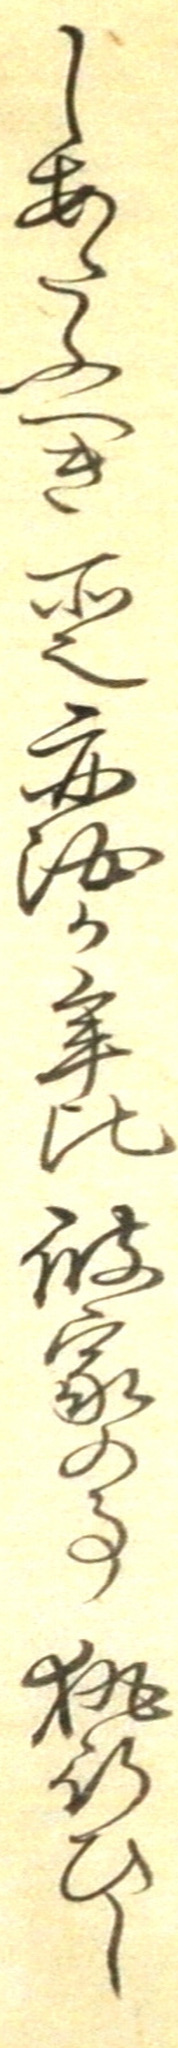しあたふへき所也亦汝か年比彼家の事執行ひし
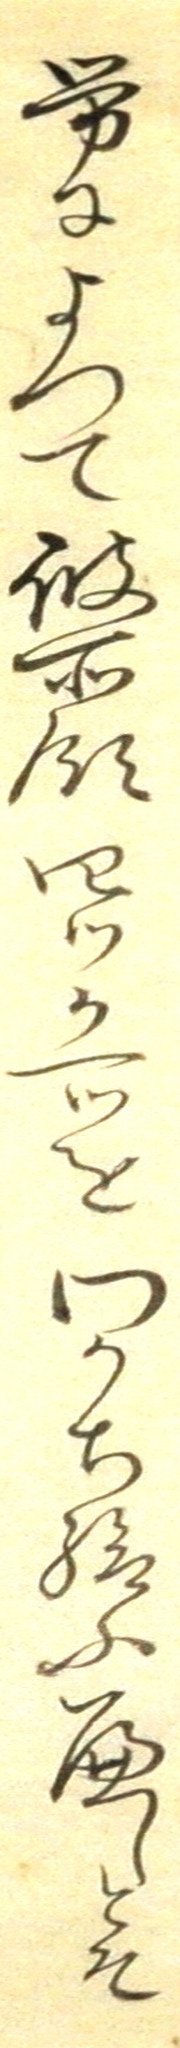労によつて彼所領四ツか一ツをわかち給ふへしとそ
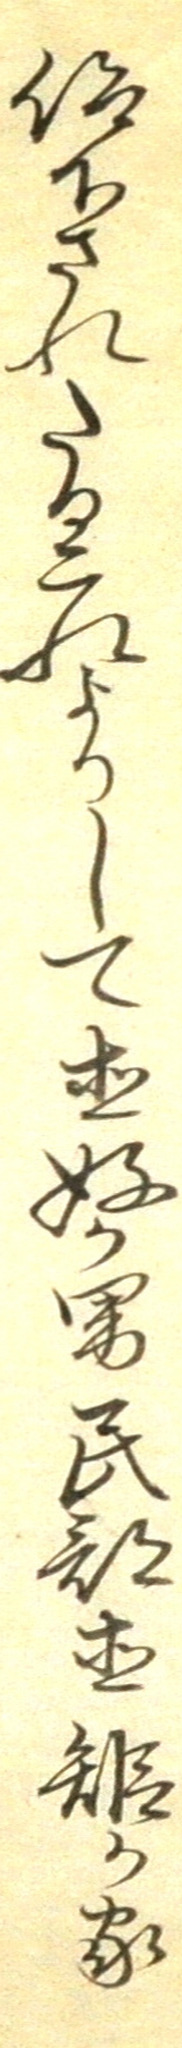仰下されたるこれよりして直好か男民部直矩か家
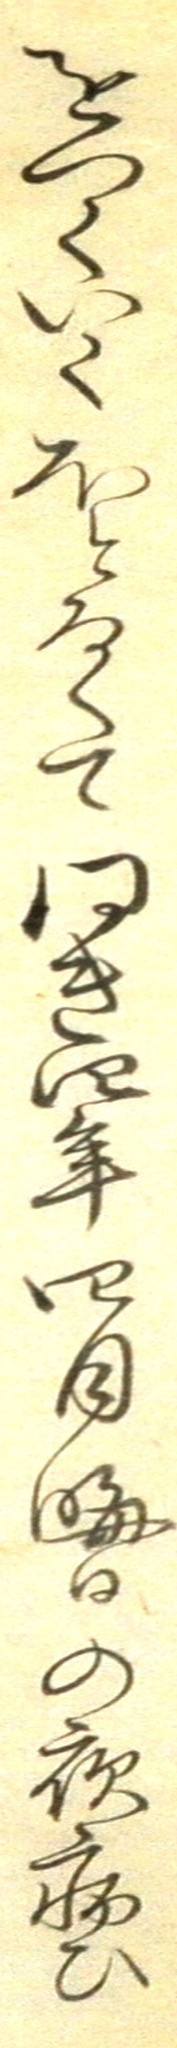をつくいくほとなくて同き四年四月晦日の夜病ひ

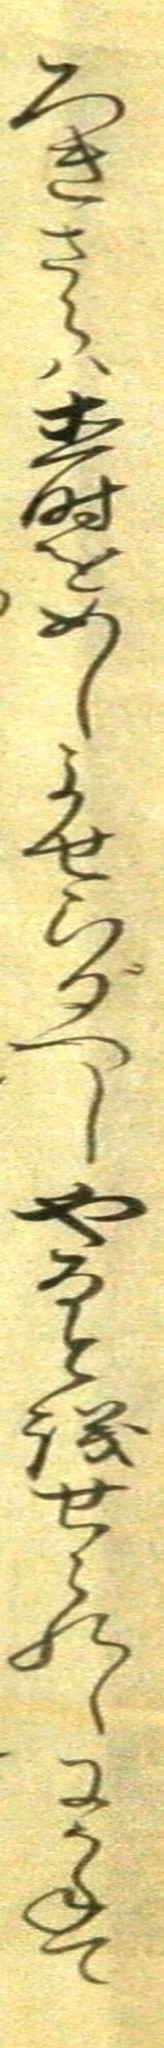ろきさらは直時をめしよせらるへしやなと議せられしにかねて
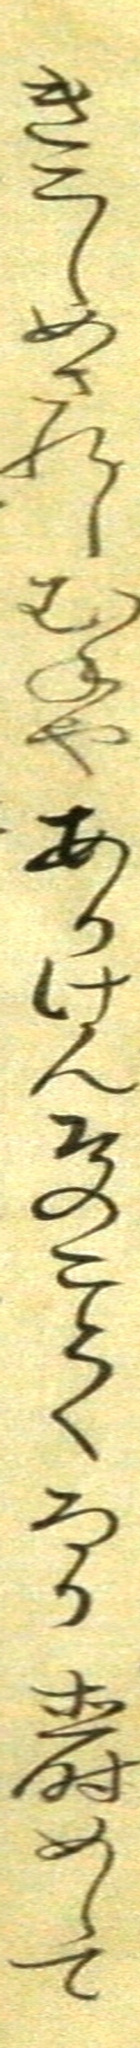きこしめされしむねやありけんそのことくなり直時めして
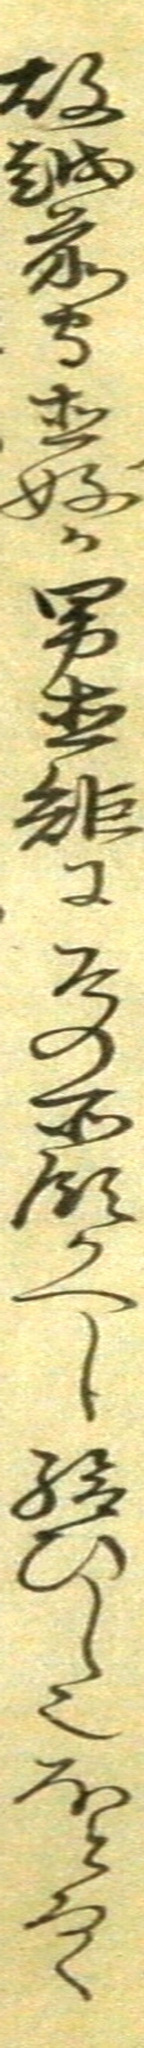故越前守直好か男直矩にその所領かへし給ひし也ほとなく
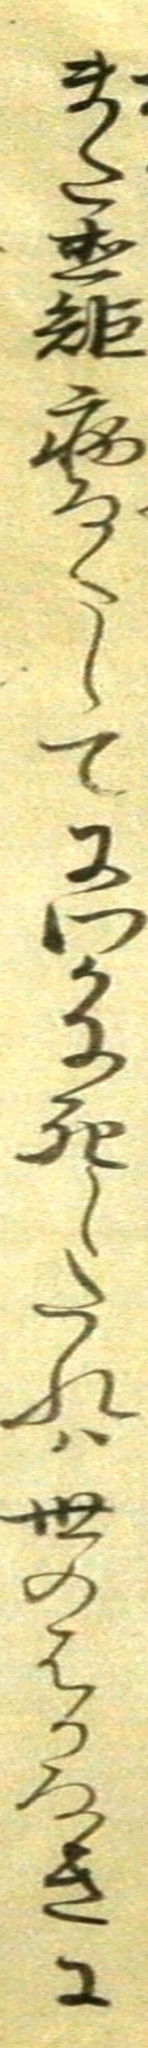また直矩病なくしてにわかに死したれは世のはかなきに
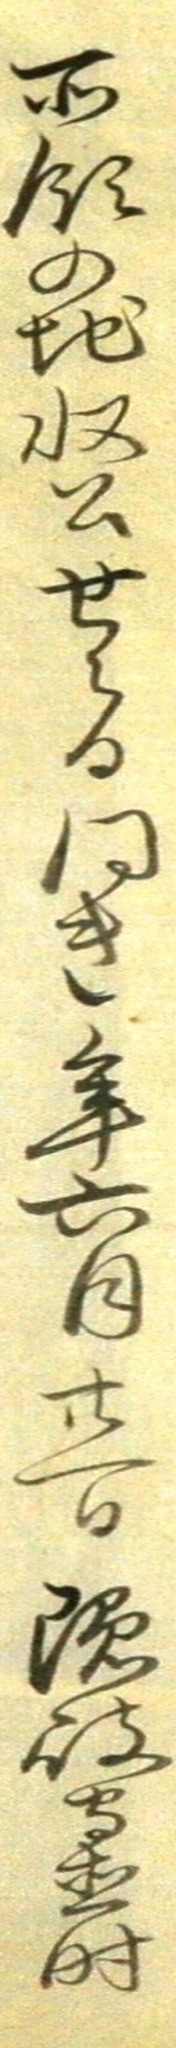所領の地收公せらる同き年六月廿一日隠岐守直時
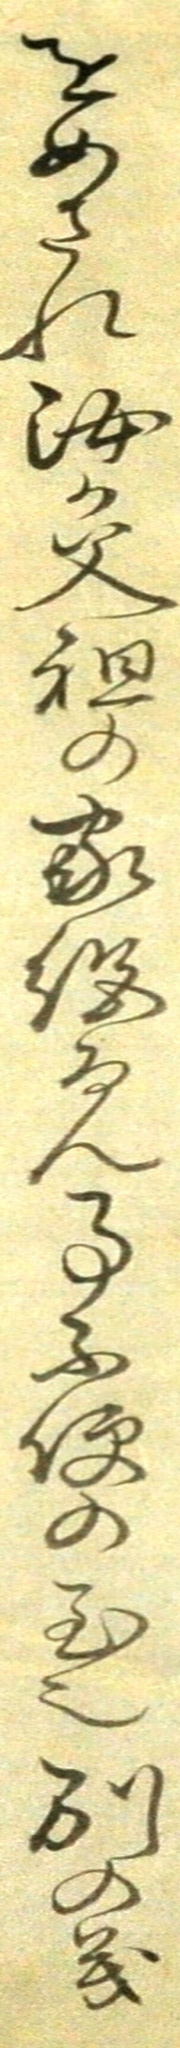をめされ汝か父祖の家絶なん事不便の至也別の義
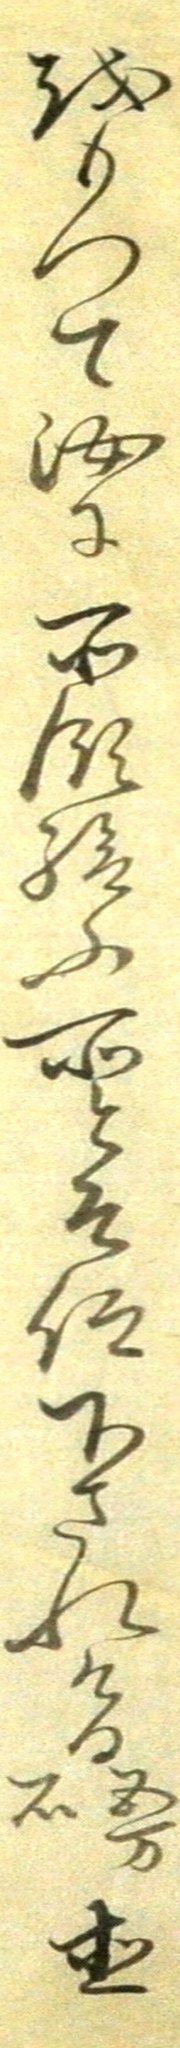をもつて汝に所領給ふ所とそ仰下されける五万石直
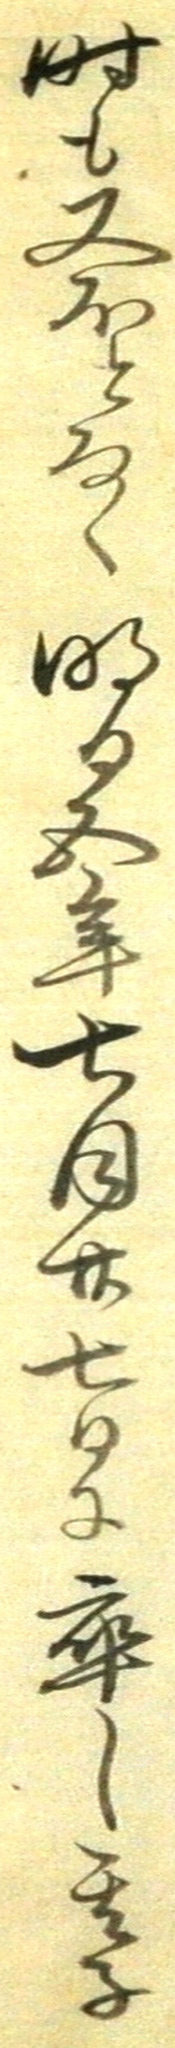時も又ほとなく明る五年七月廿七日に卒し其子
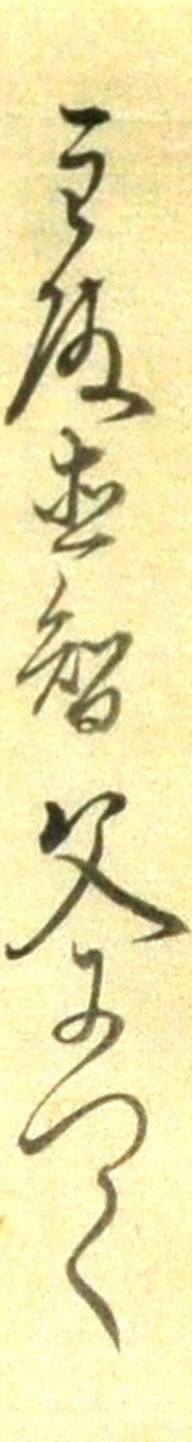主殿直智父につく
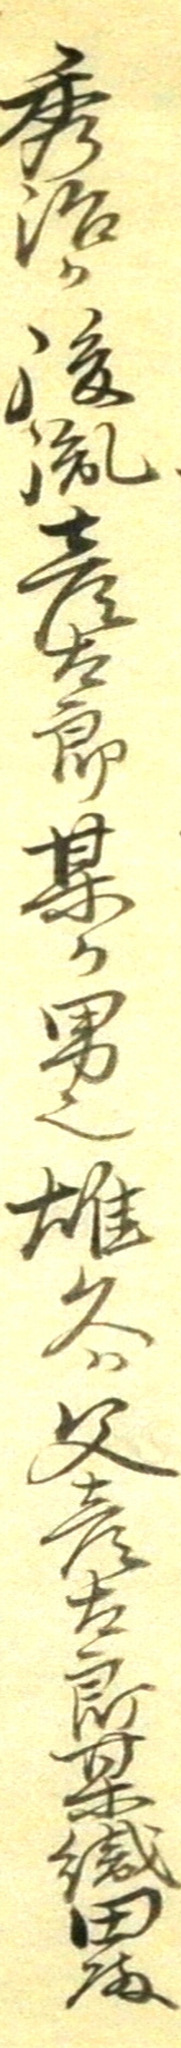秀治か後胤彦太郎某か男也雄久か父彦太郎某織田殿
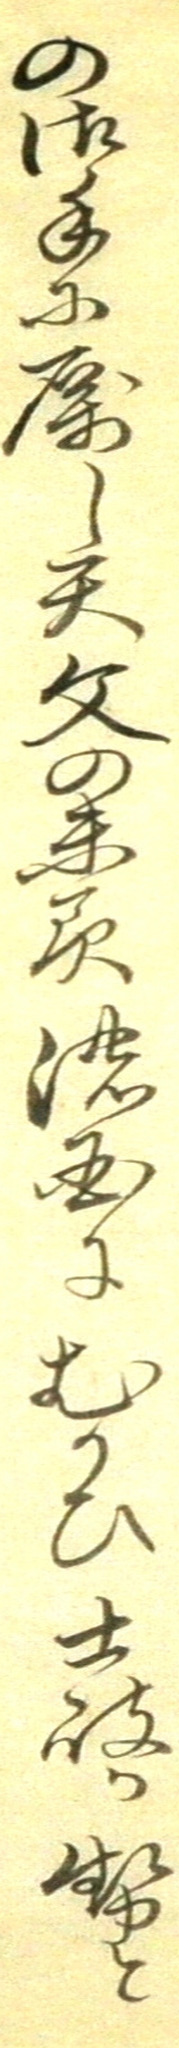の御手に属し天文の末美濃国にむかひ土岐か勢と
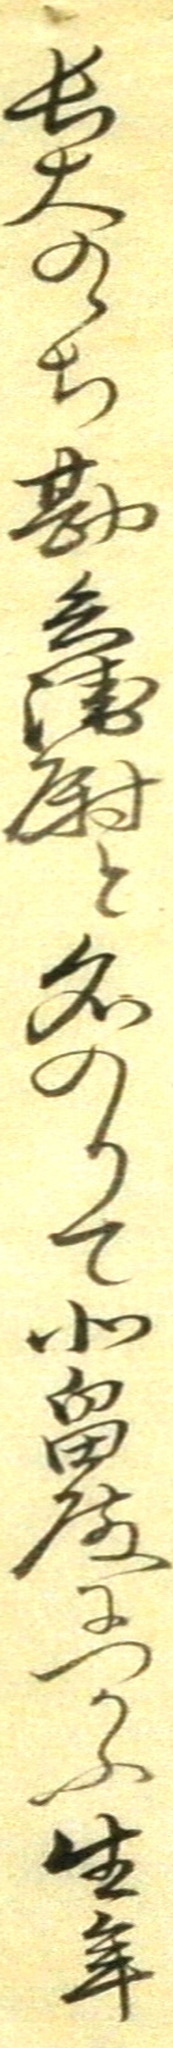長大のゝち勘兵衛尉と名のりて北畠殿につかふ生年
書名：藩翰譜（八・下）
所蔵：伊那市立高遠町図書館・合同会社AMANE
